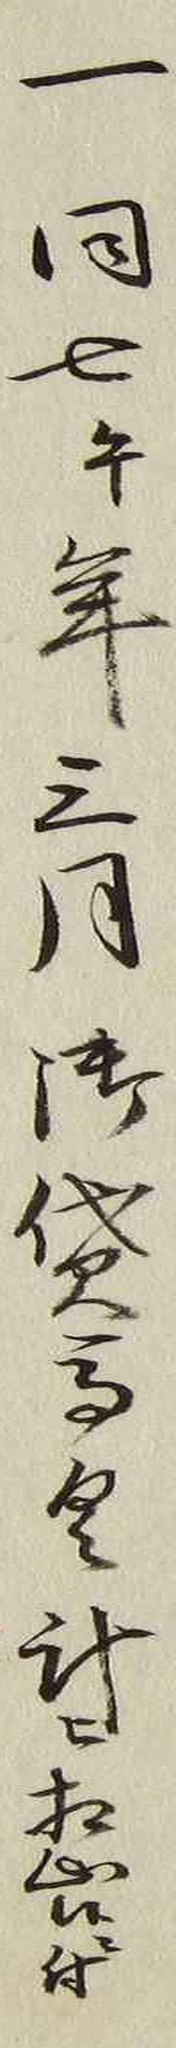一同七午年三月御貸馬具計被相止候ニ付
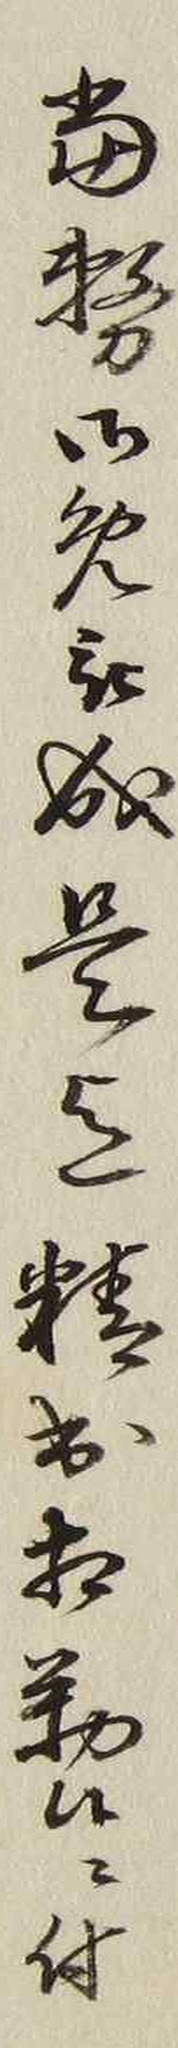当務御免被成是迄精出相勤候ニ付
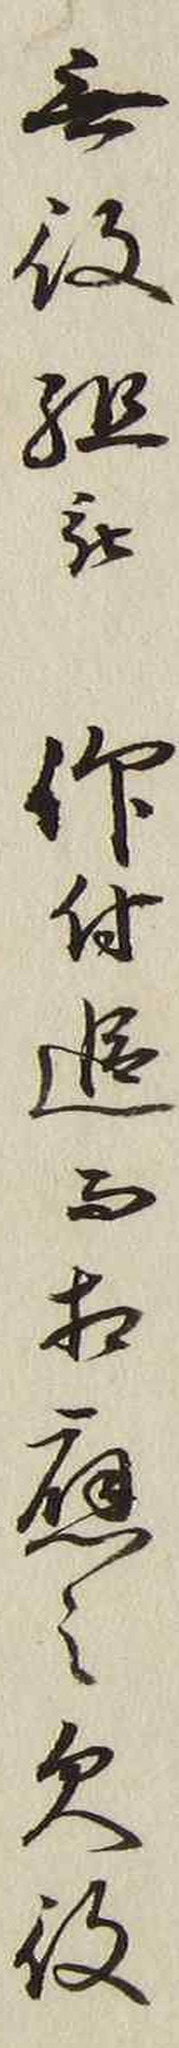無役組被仰付追而相応の欠役

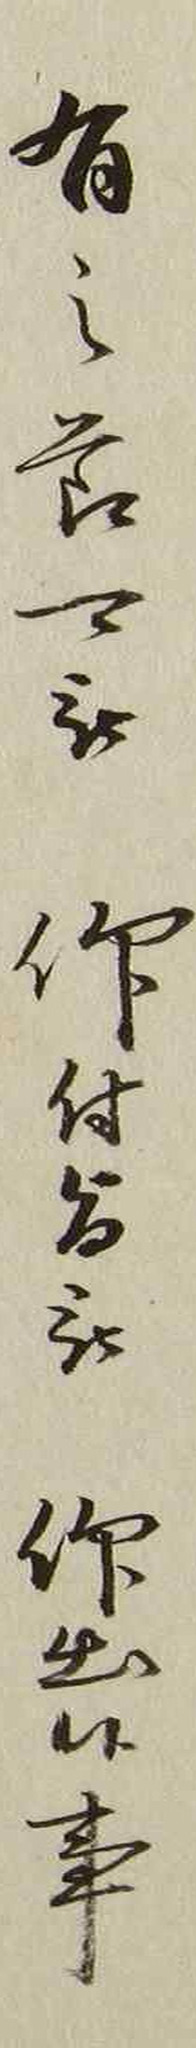有之節可被仰付旨被仰出候事
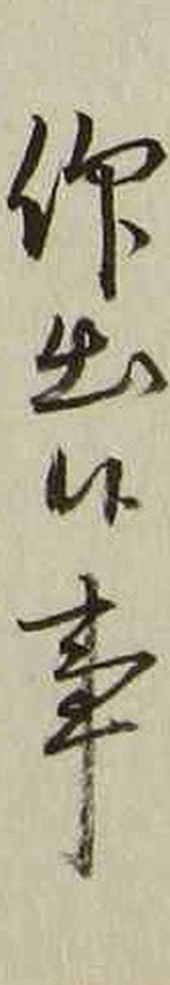仰出候事
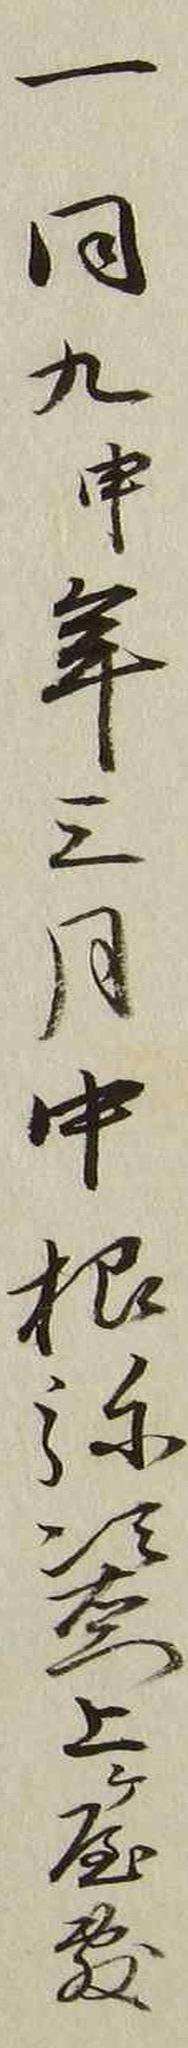一同九申年三月中根弥次右衛門上ケ屋敷
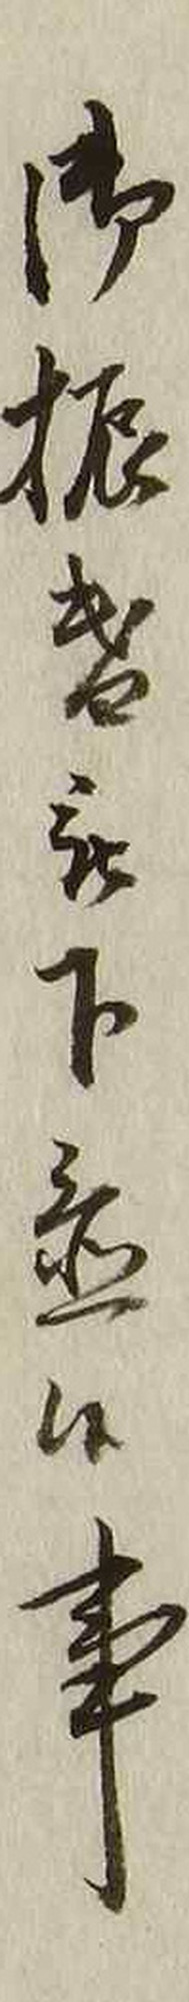御振替被下置候事
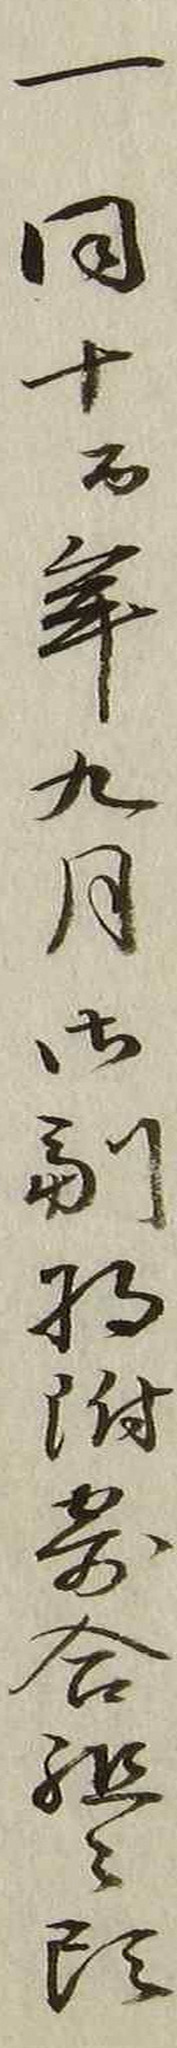一同十酉年九月御副将附寄合組々頭
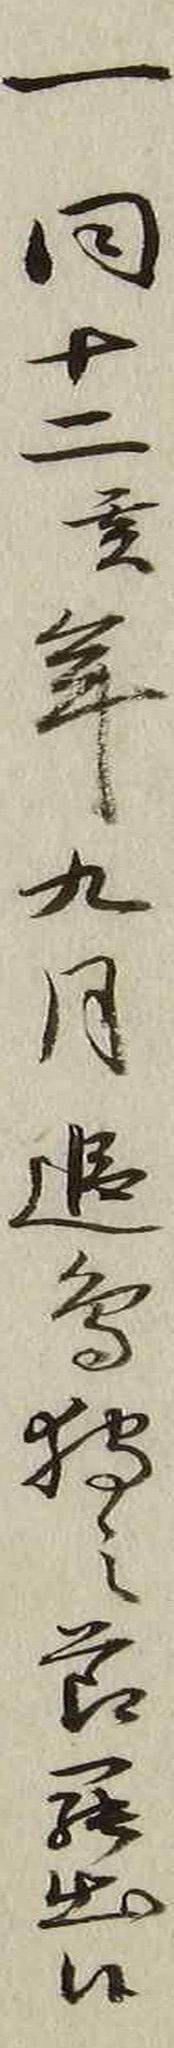一同十二亥年九月追鳥狩之節罷出候
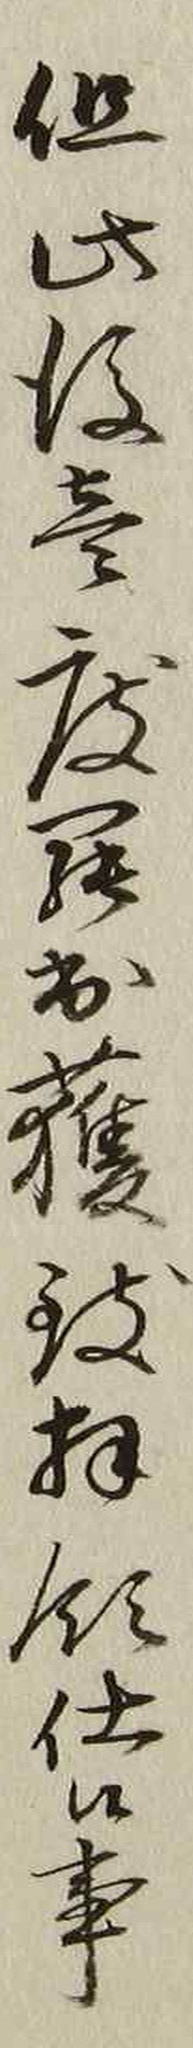但此後壱度罷出獲致拝領仕候事
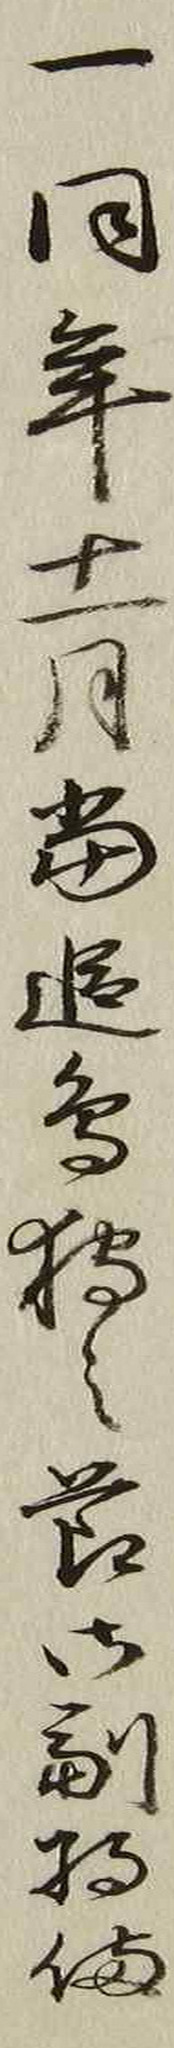一同年十一月当追鳥狩之節御副将へ
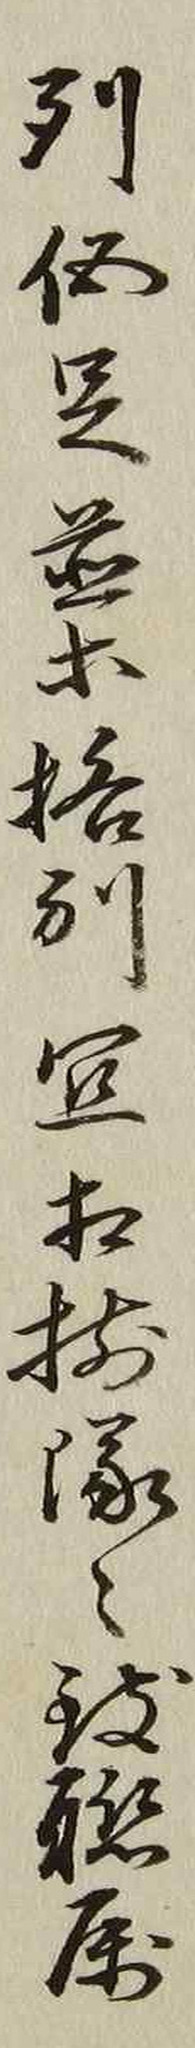列伍足並等格別宜相揃隊々致聯属
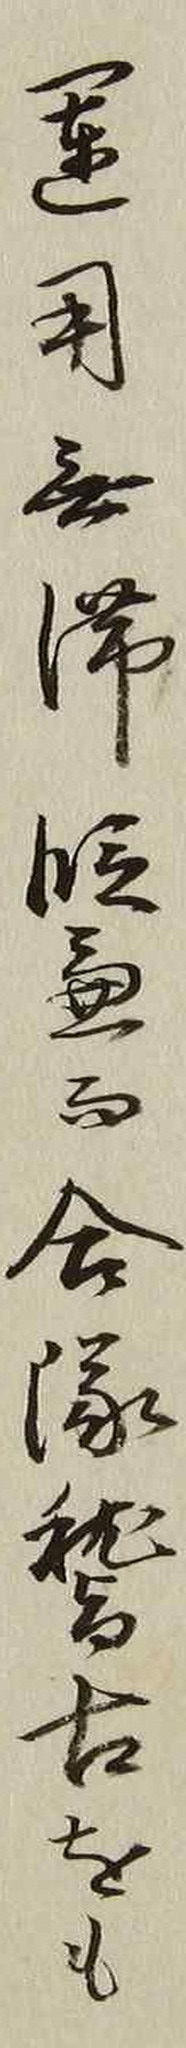運用無滞段兼而合隊稽古をも
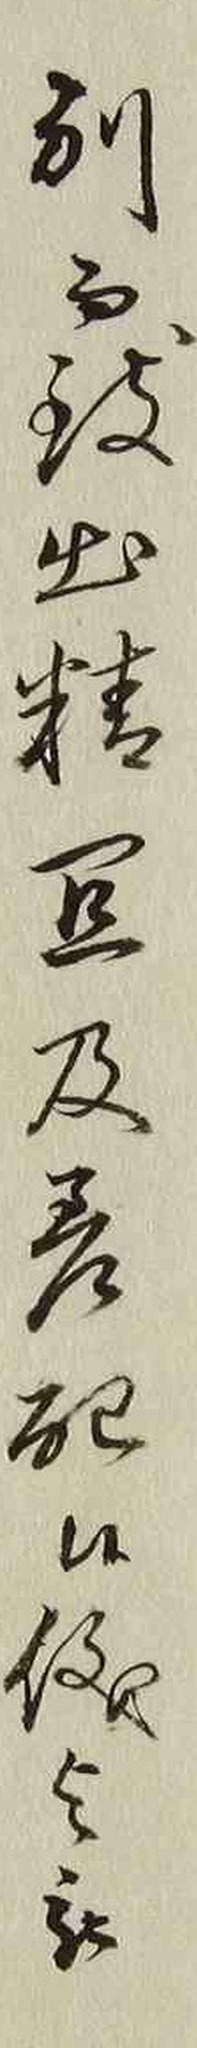別而致出精宜及差配候儀と被
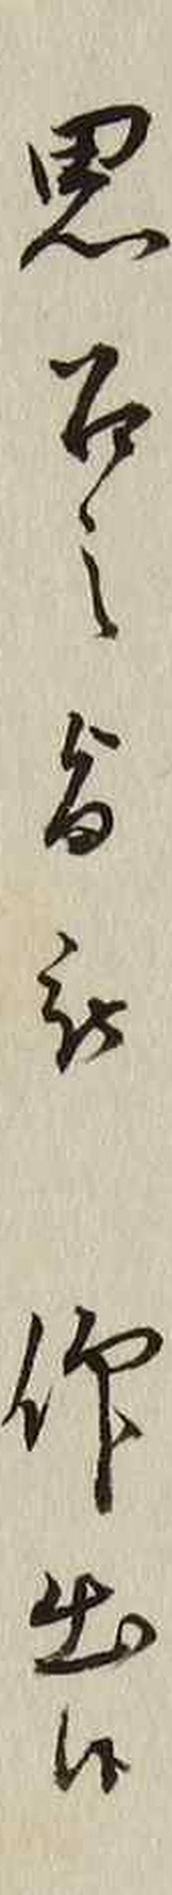思召之旨被仰出候
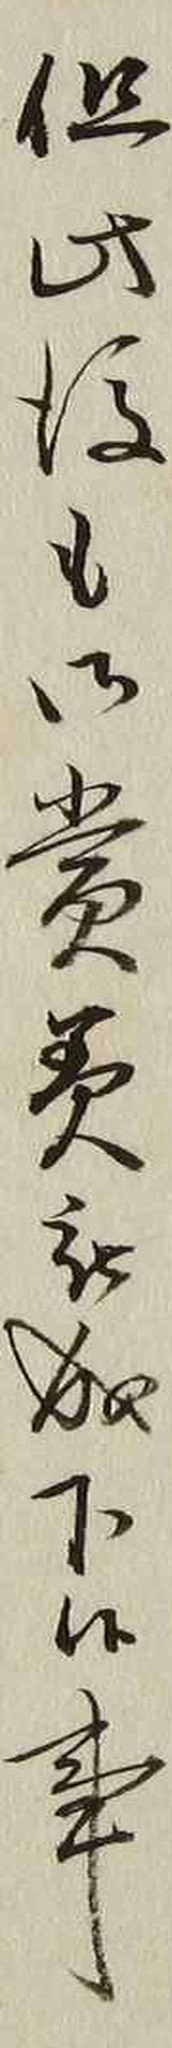但此後も御賞美被成下候事
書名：諸士系譜　巻之160　な之部2
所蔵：会津若松市立会津図書館
